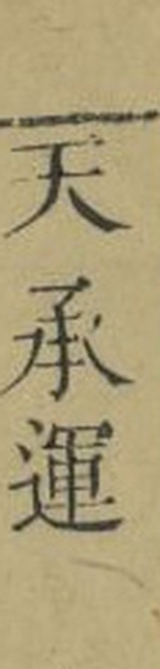天承運
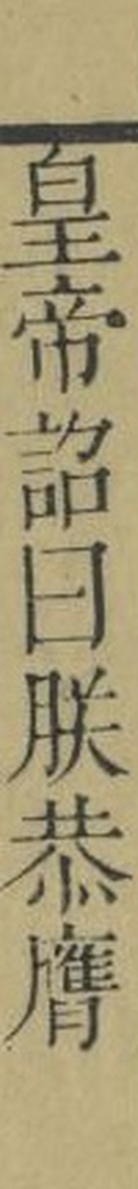皇帝詔曰朕恭膺
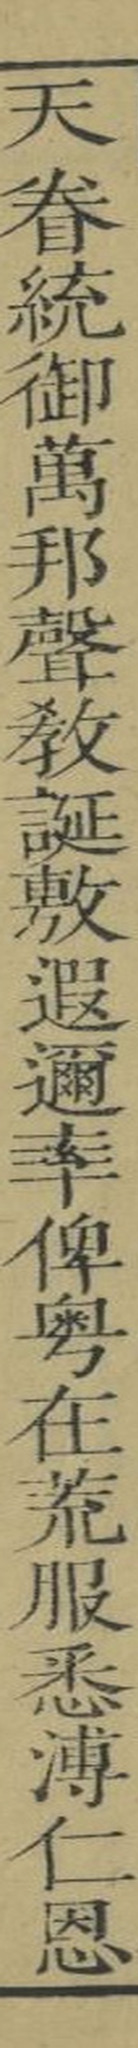天眷統御萬邦聲敎誕敷遐邇率俾粤在荒服悉溥仁恩
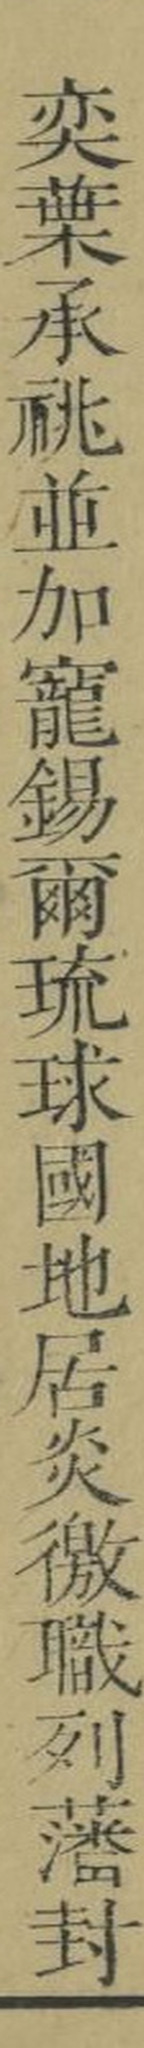奕葉承祧並加寵錫爾琉球國地居炎徼職列藩封
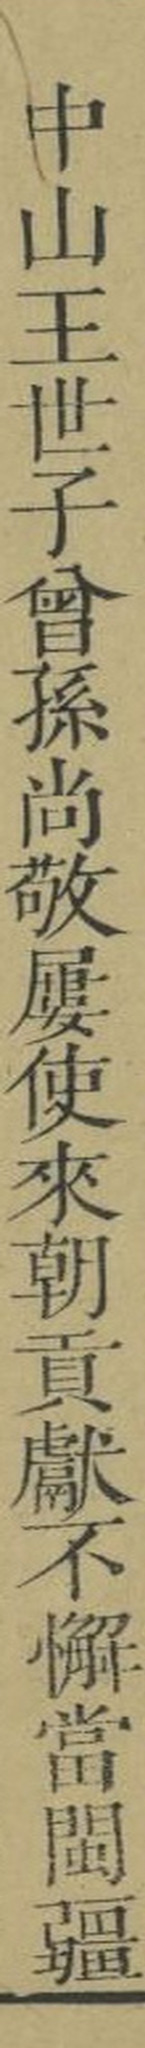中山王世子曾孫尚敬屢使來朝貢獻不懈當閩疆
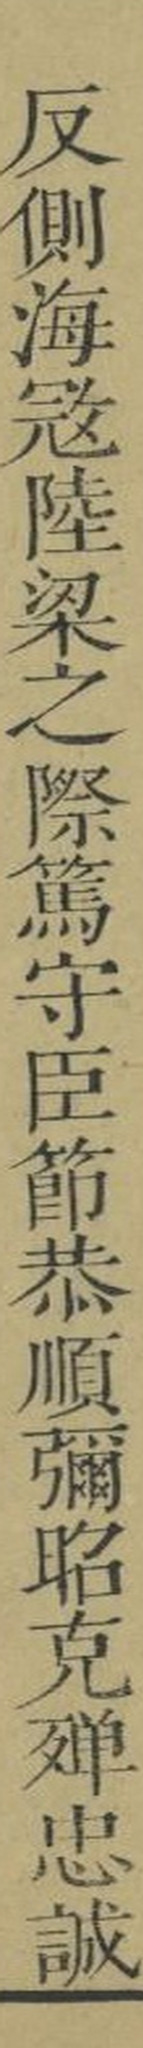反側海冦陸梁之際篤守臣節恭順彌昭克殚忠誠
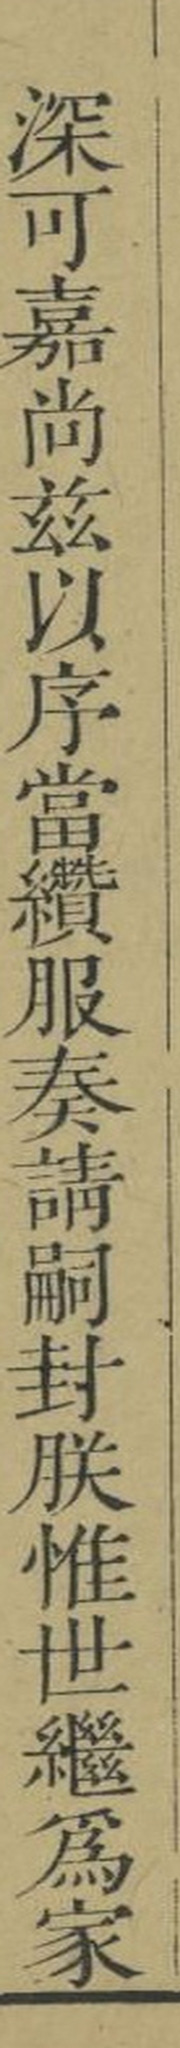深可嘉尚茲以序當纘服奏請嗣封朕惟世繼爲家
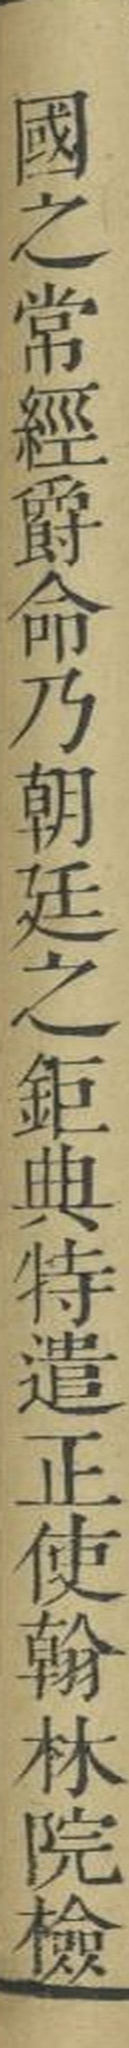國之常經爵命乃朝廷之鉅典特遣正使翰林院檢
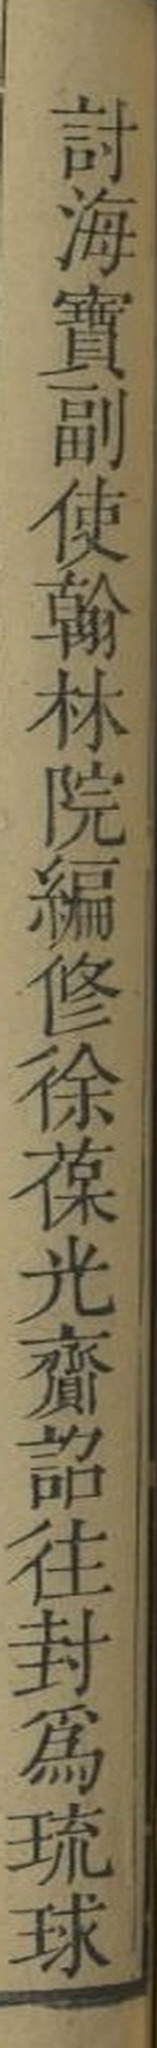討海寶副使翰林院編修徐葆光齎詔往封爲琉球
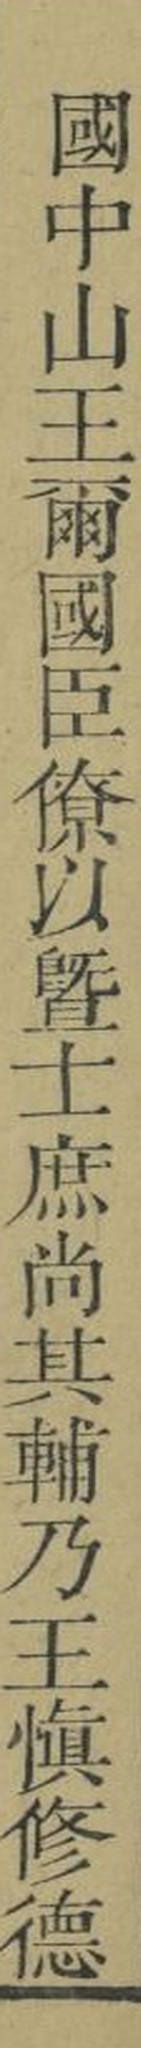國中山王爾國臣僚以曁士庶尚其輔乃王愼修德
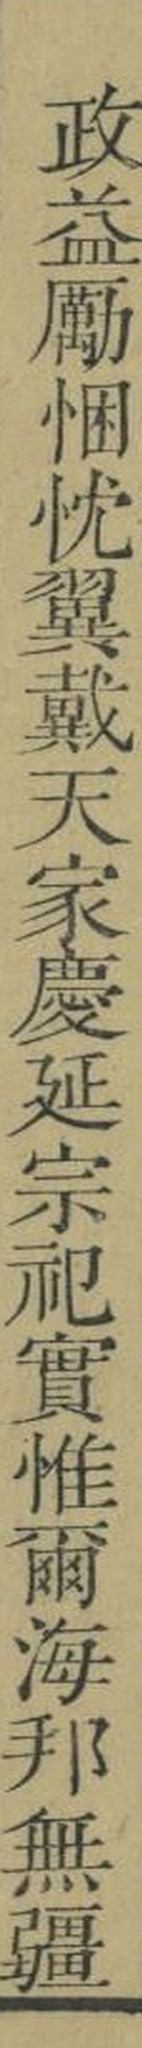政益勵悃忱翼戴天家慶延宗祀實惟爾海邦無疆
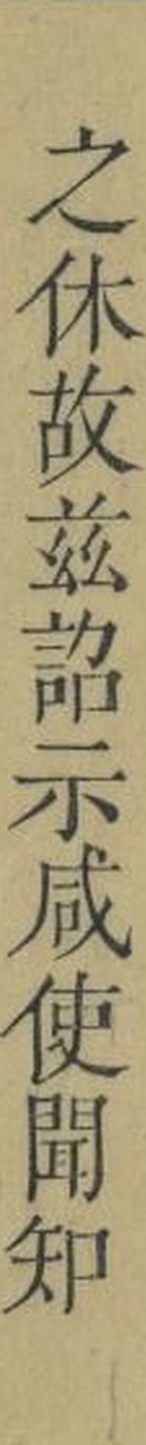之休故茲詔示咸使聞知
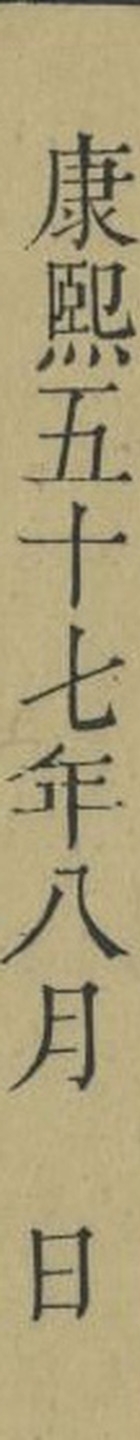康煕五十七年八月日
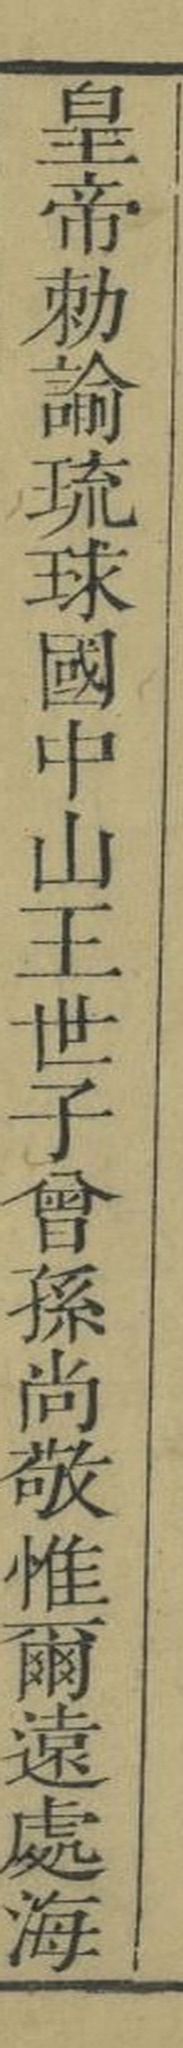皇帝勅諭琉球國中山王世子曾孫尚敬惟爾遠處海
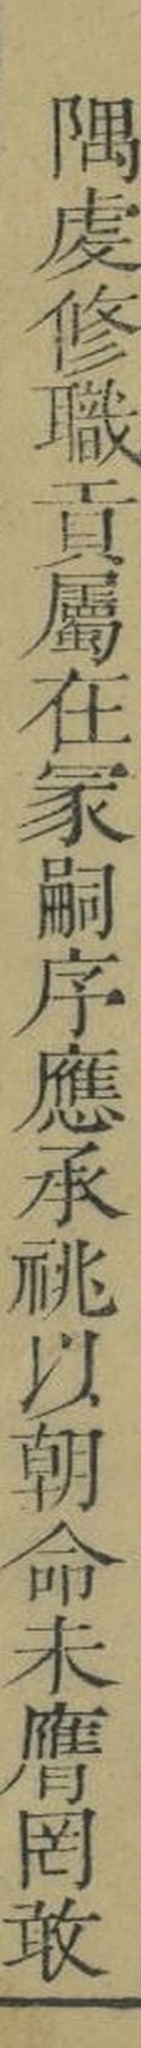隅虔修職貢屬在冡嗣序應承祧以朝命未膺罔敢
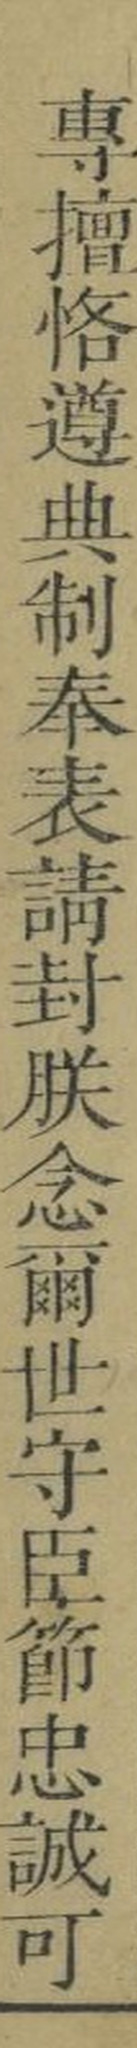專擅悋遵典制奉表請封朕念爾世守臣節忠誠可
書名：中山伝信録 巻二
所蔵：University of the Ryukyus Library
